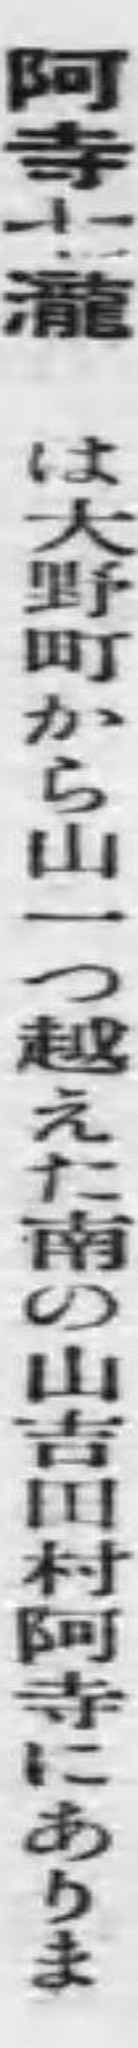阿寺七瀧は大野町から山一つ越えた南の山吉田村阿寺にありま
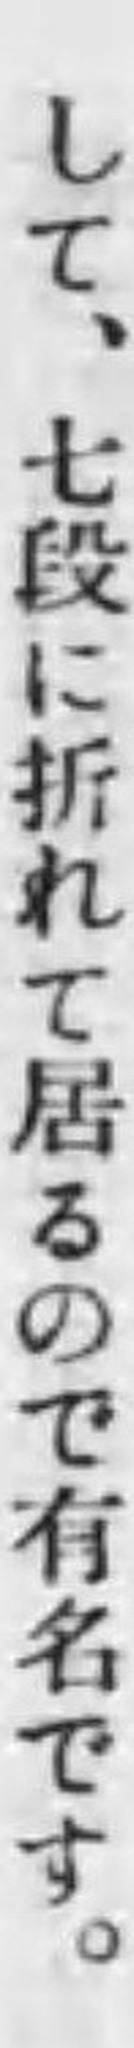して、七段に折れて居るので有名です。
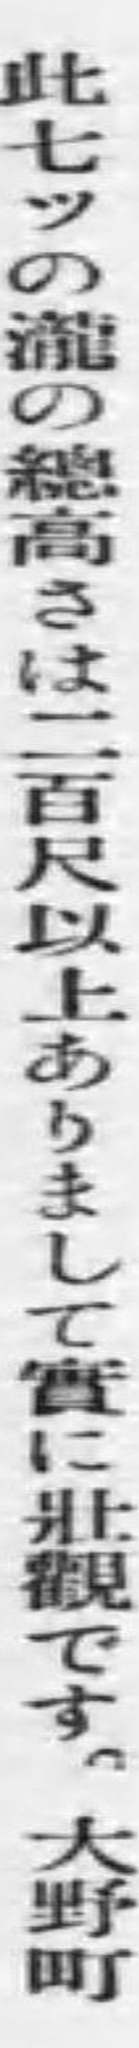此七ツの瀧の總高さは二百尺以上ありまして實に壯觀です。大野町
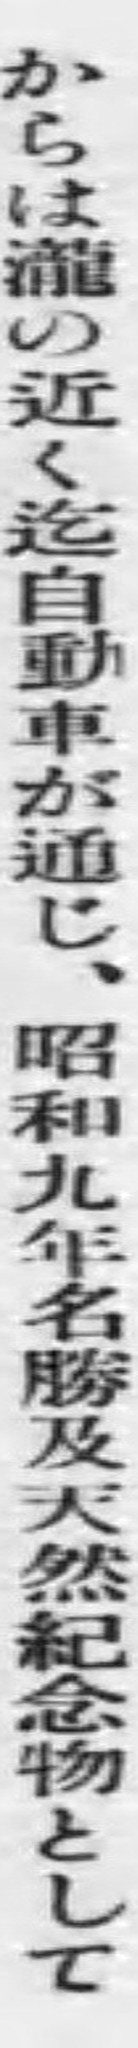からは瀧の近く迄自動車が通じ、昭和九年名勝及天然紀念物として
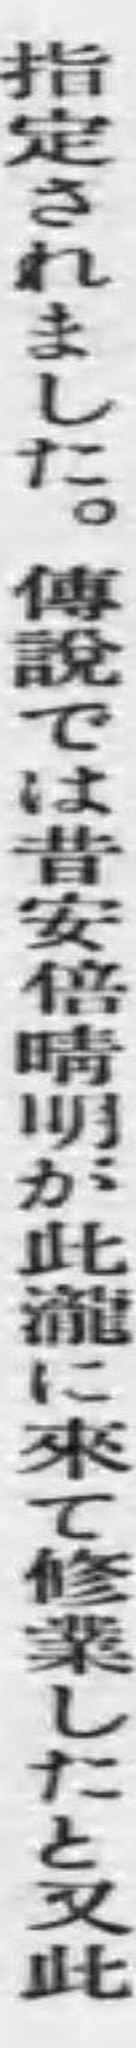指定されました。傳説では昔安倍清明が此瀧に來て修業したと又此
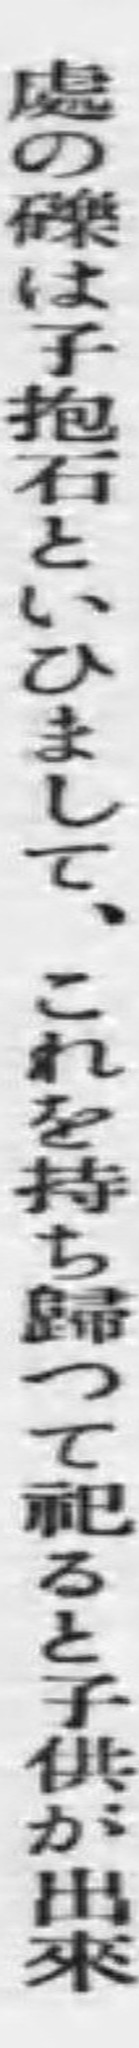處の礫は子抱石といひまして、これを持ち歸つて祀ると子供が出來
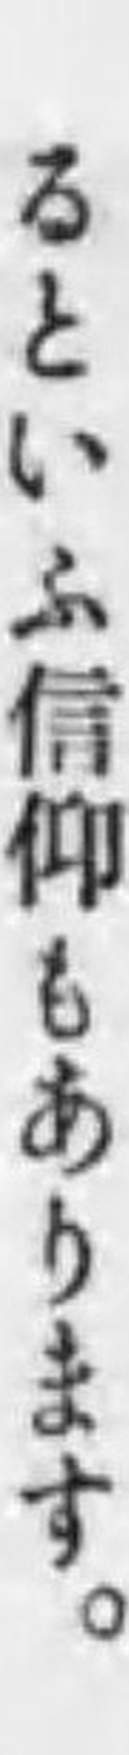るといふ信仰もあります。
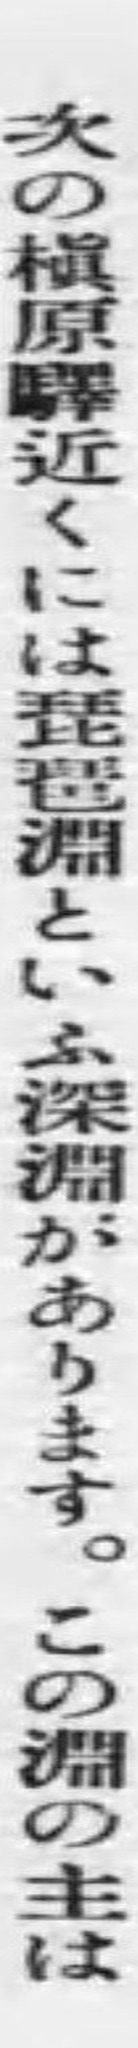次の槇原驛近くには琵琶淵といふ深淵があります。この淵の主は
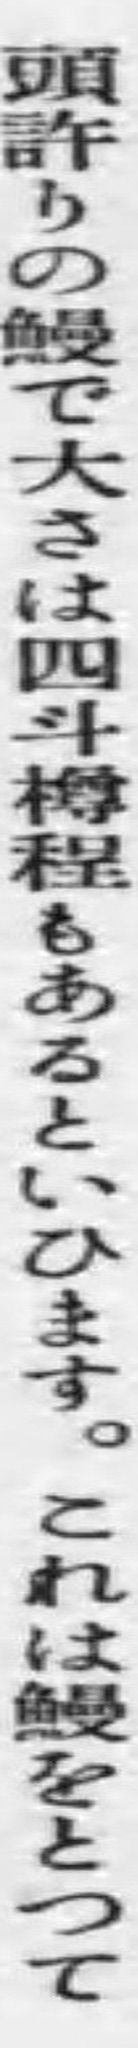頭許りの鰻で大さは四斗樽程もあるといひます。これは鰻をとつて
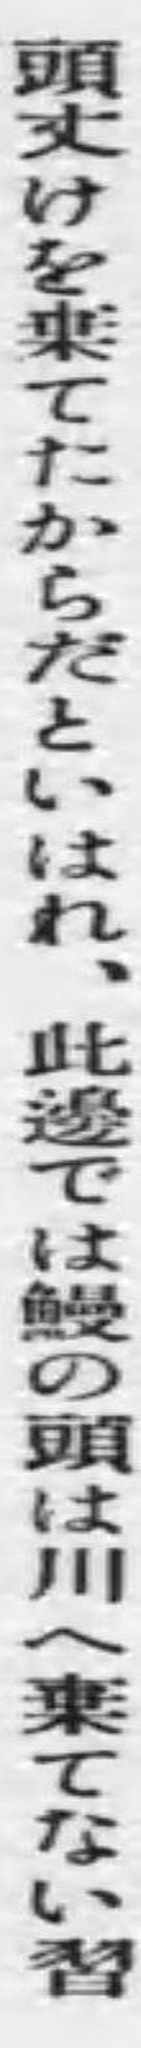頭丈けを棄てたからだといはれ、此邊では鰻の頭は川へ棄てない習
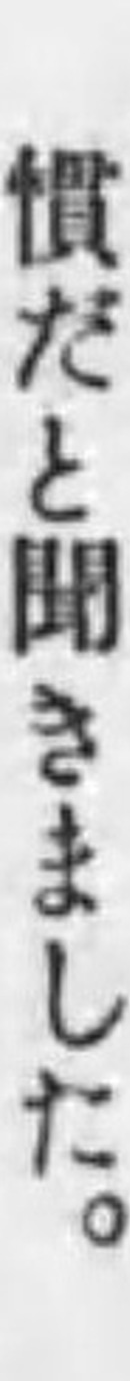慣だと聞きました。
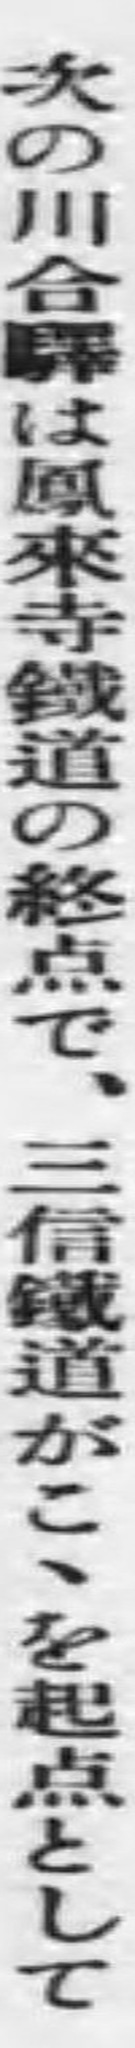次の川合驛は鳳來寺鐵道の終点で、三信鐵道がこヽを起点として
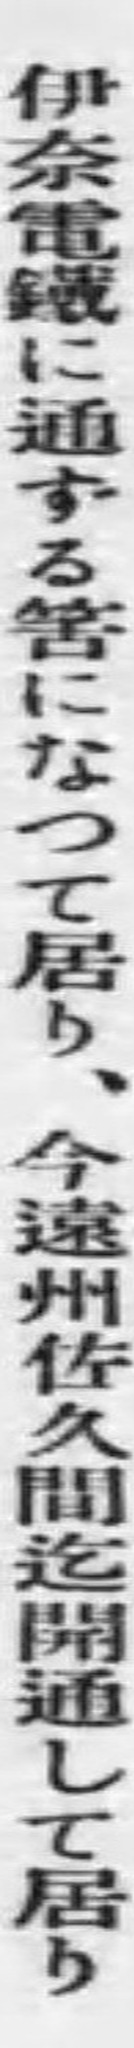伊奈電鐵に通ずる筈になつて居り、今遠州佐久間迄開通して居り
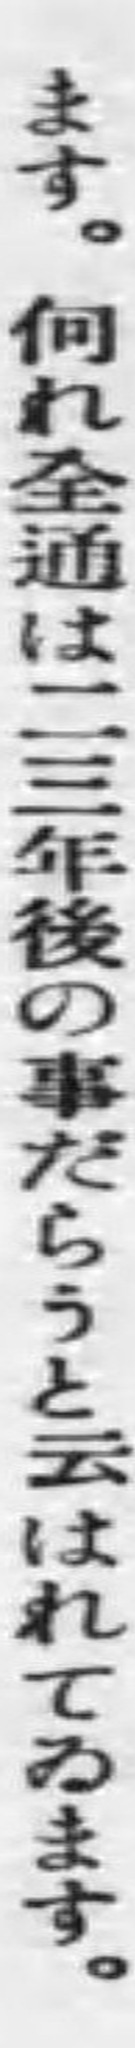ます。何れ全通は二三年後の事だらうと云はれてゐます。

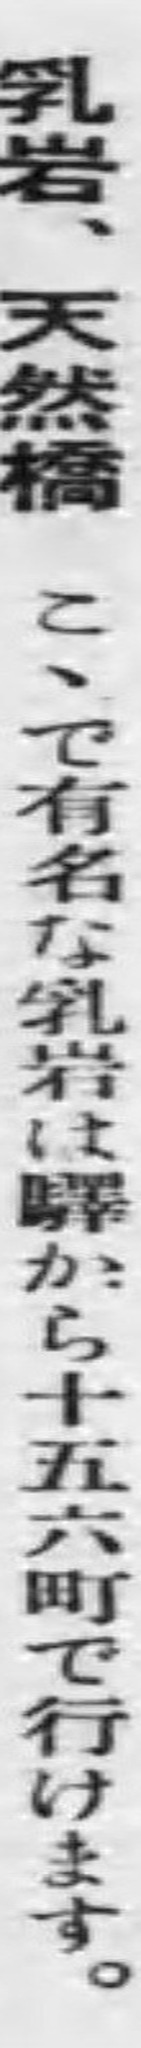乳岩、天然橋こヽで有名な乳岩は驛から十五六町で行けます。
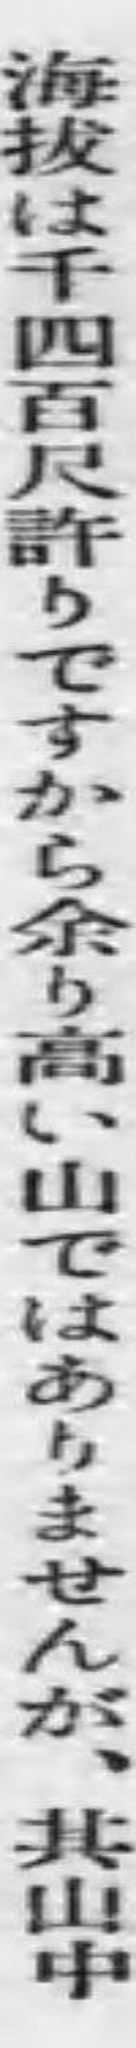海抜は千四百尺許りですから余り高い山ではありませんが、其山中
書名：東三河道中記 : 豊橋市及其附近案内
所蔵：国立国会図書館 National Diet Library, JAPAN
